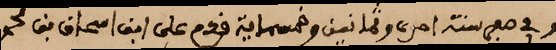وفي صفر سنة احدى وثمانين وخمسماية قدم على ابن اسحاق بن محمد
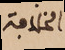الخلافة
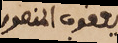يعقوب المنصور
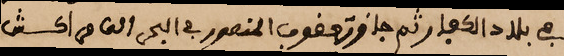في بلاد الكفار ثم جاز يعقوب المنصور في البحر الى مراكش
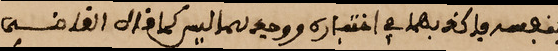بنفسه فاكذبهما في اختباره ووجدهما ليس كما قال القاضي
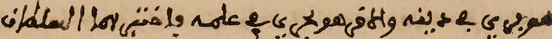بري في دينه والأخر بحري في علمه فاختبرهما السلطان
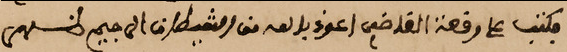فكتب على رقعة القاضي اعوذ بالله من الشيطان الرجيم ظهر
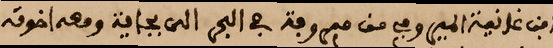ابن غانية الميروفي من ميروفة في البحر الى بجاية ومعه اخوته
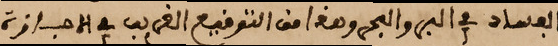الفساد في البر والبحر وهذا من التوقيع الغريب في الاجازة
